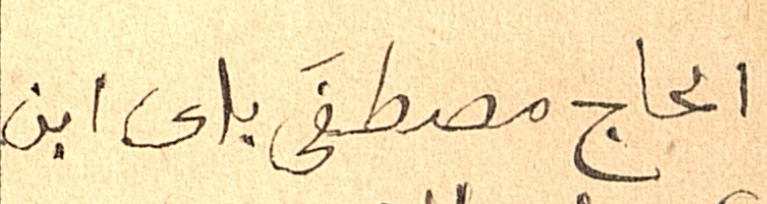الحاج مصطفى باى ابن
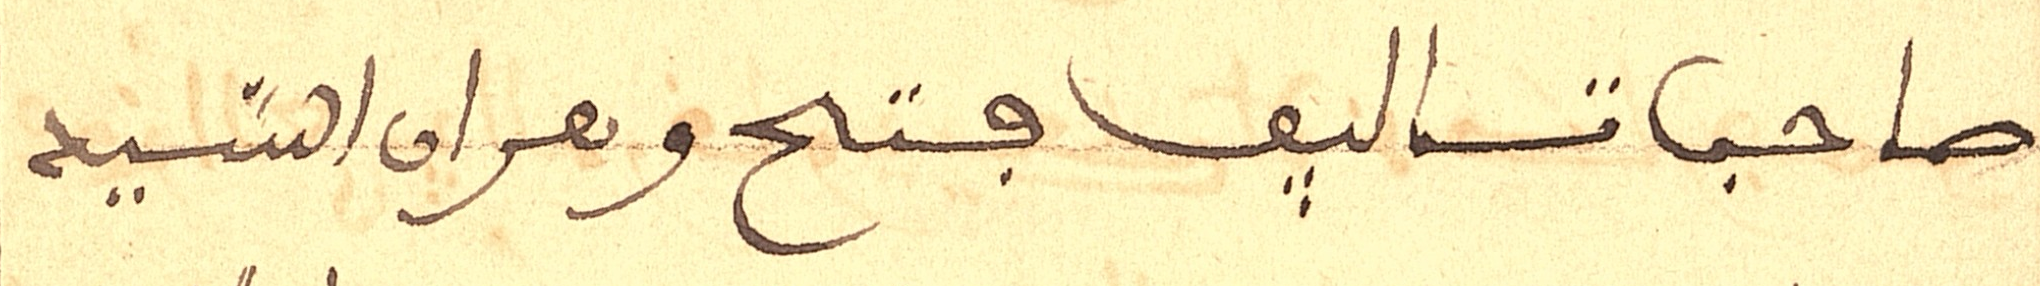صاحب تاليف فتح وهران السيد
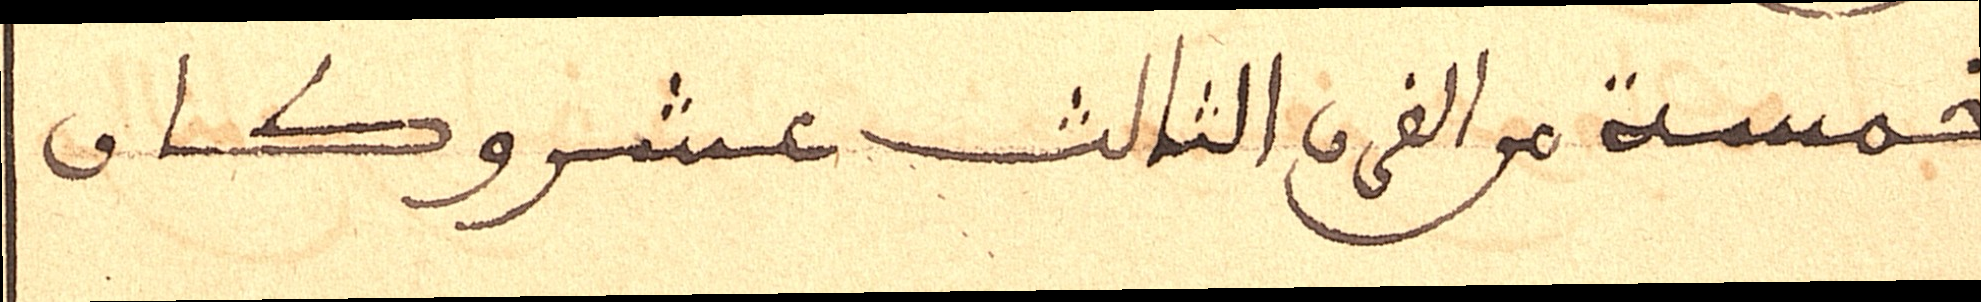خمسة من القرن الثالث عشر وكان
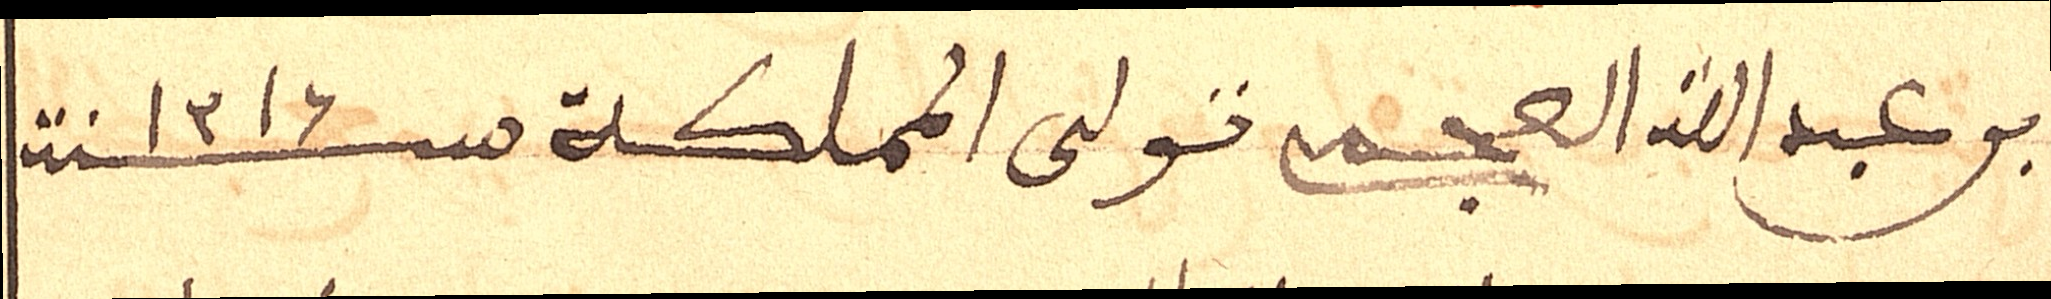بن عبد الله العجمى تولى المملكة سنة
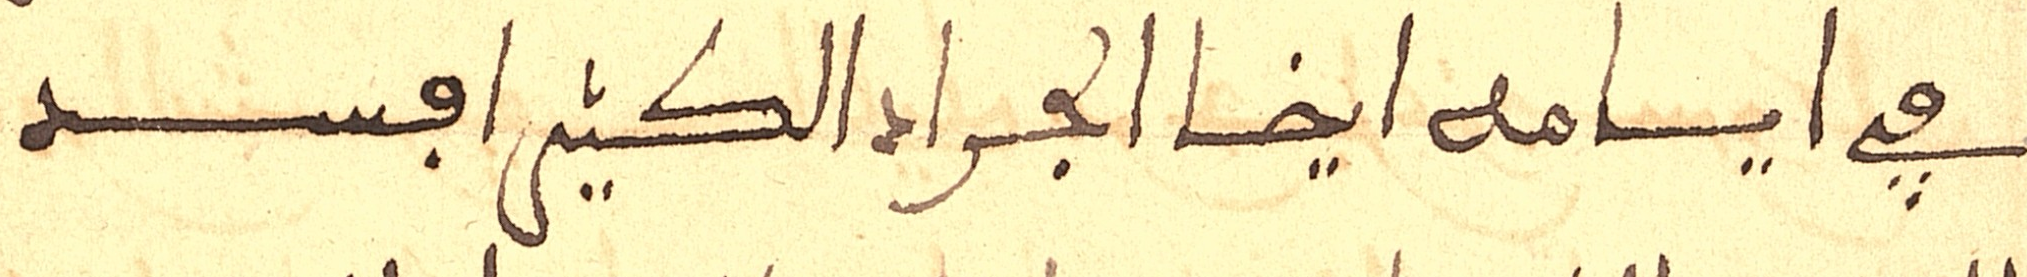في ايامه ايضا الجزاء الكثير افسد
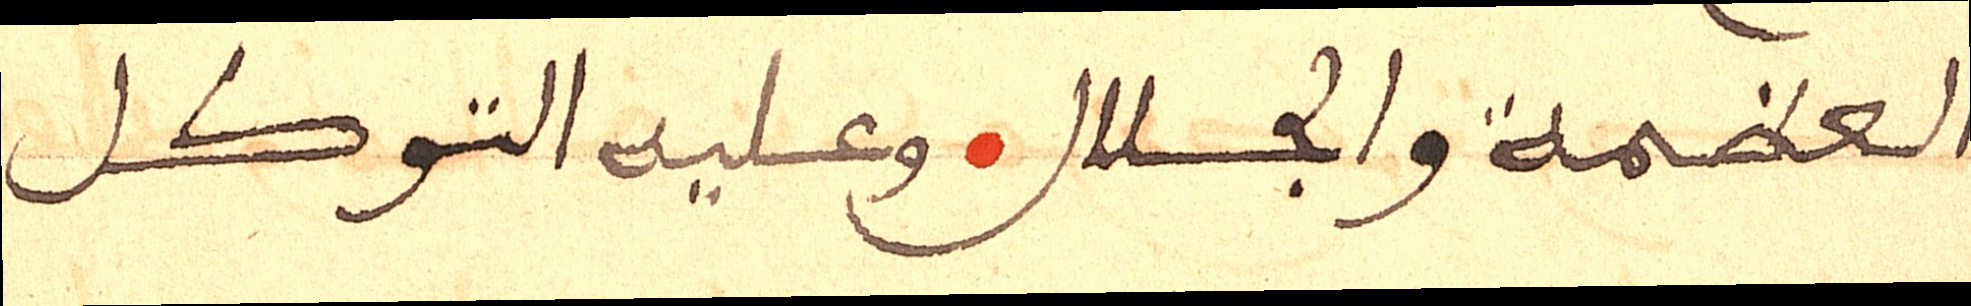العظمة والجلال وعليه التوكل
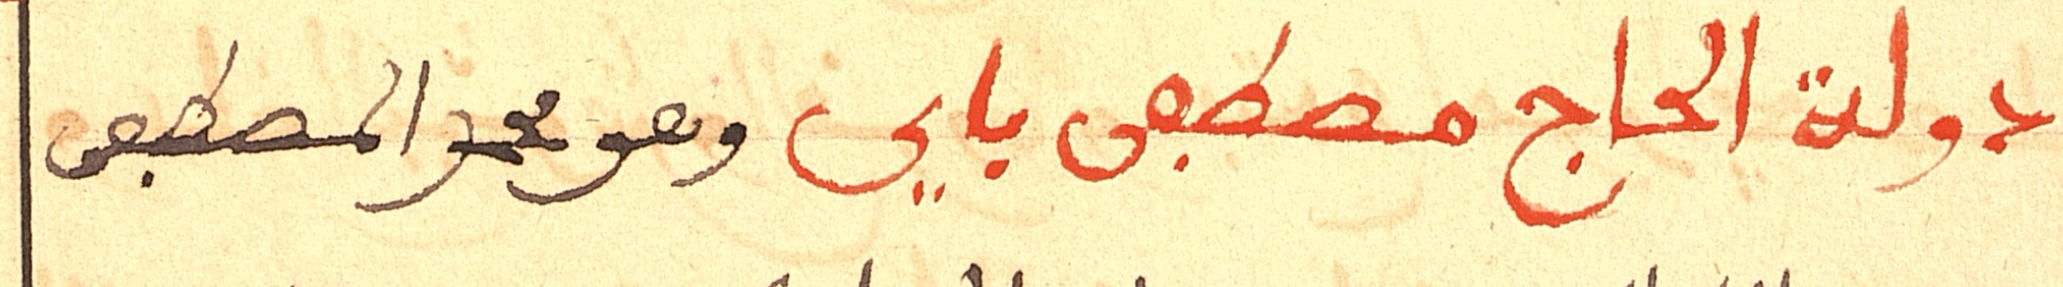دولة الحاج مصطفى باي وهو محمد المصطفى
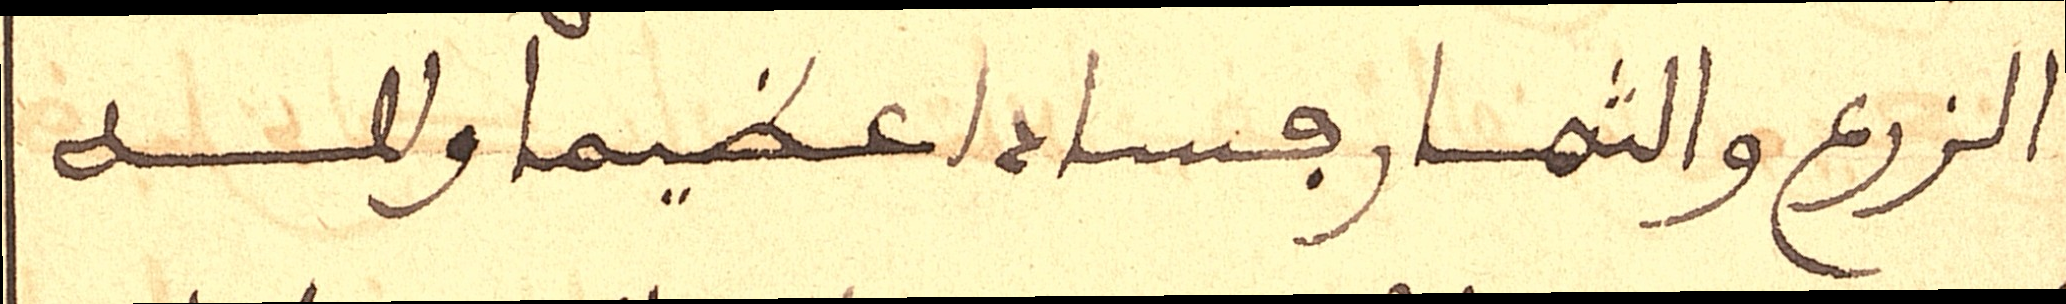الزرع والثمار فساد اعظيما ولله
